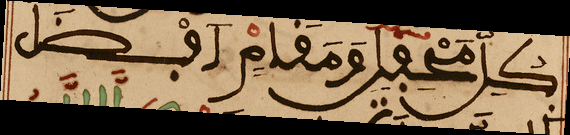كل محفل ومقام افضل
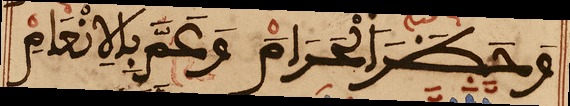وحظرالحرام وعم بالانعام
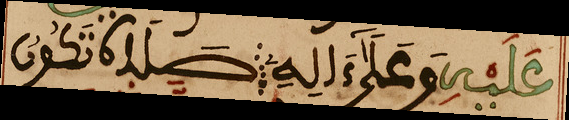عليه وعلى آ إله صلاة تكون
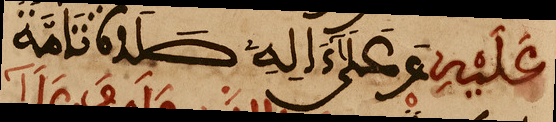عليه وعلى آ إله صلاة تامة
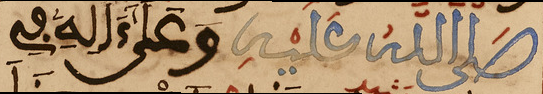صلى الله عليه وعلى آ إله من
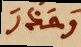وحذر
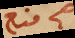م منع
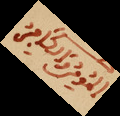المومن والكافر
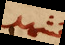مشهد
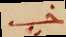خ
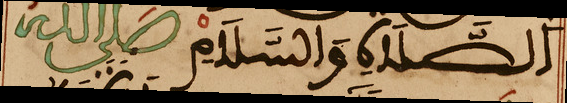الصلاة والسلام صلى الله
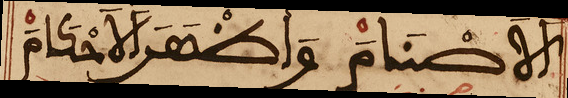الاصنام وأظهرالاحكام
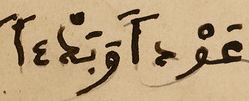عودا وبدعا
